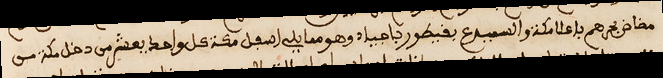مضاض بجرهم باعلا مكة و السميدع بقيطور باجياد و هو مما يلى اسفل مكة كل واحد يعش من دخل مكة من
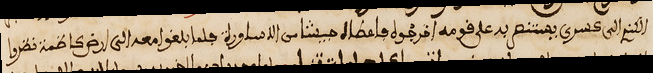الكندي الى كسرى يستنصر به على قومه اخرجوه فاعطاه جيشا من الاساورة فلما بلغوا معه الى ارض كاظمة نظروا
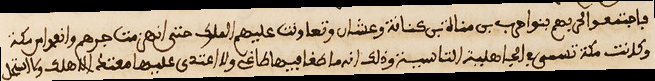فاجتمعوا لحربهم بنوا حرب بن مناة بن كنانة وعشان و تعاونت عليهم الملوك حتى انهزمت جرهم و انفوا من مكة
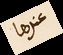عندها
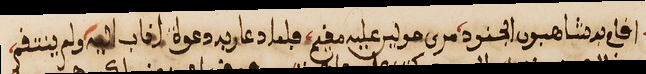اقام به شاهبونالجنود مدى حولين عليه مقيم فلماذا دعا ربه دعوة اناب اليه و لم ينتقم
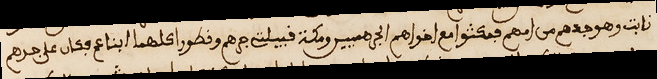نابت وهو جدهم من امهم فمكثوا مع اخوانهم الجرهميين و مكة قبيلة جرهم و قطورا كلهما ابناعم فكان على جرهم
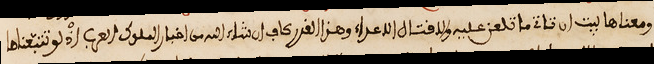و معناها بيت ان تاتى ما تلعن عليه و الاقتال الاعداء و هذا القدر كاف ان شاء الله من اخبار الملوك العرب اذ لو تتبعناها
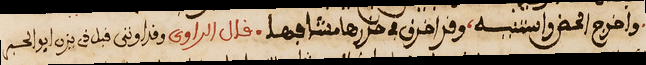و اخرج الحصن و استنيه و قد اخرق في حزرها مشافها قال الراوي و قد اوتي قبل ذي يزن ابو الحبر
